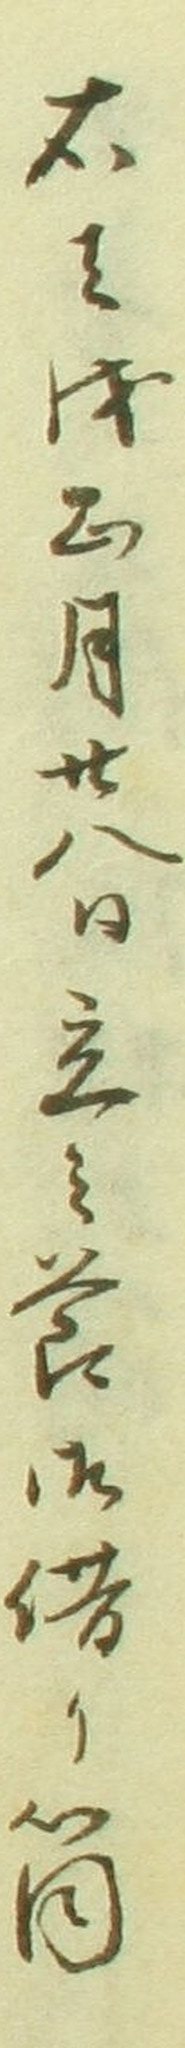右は戌正月廿八日立之節御借り筒
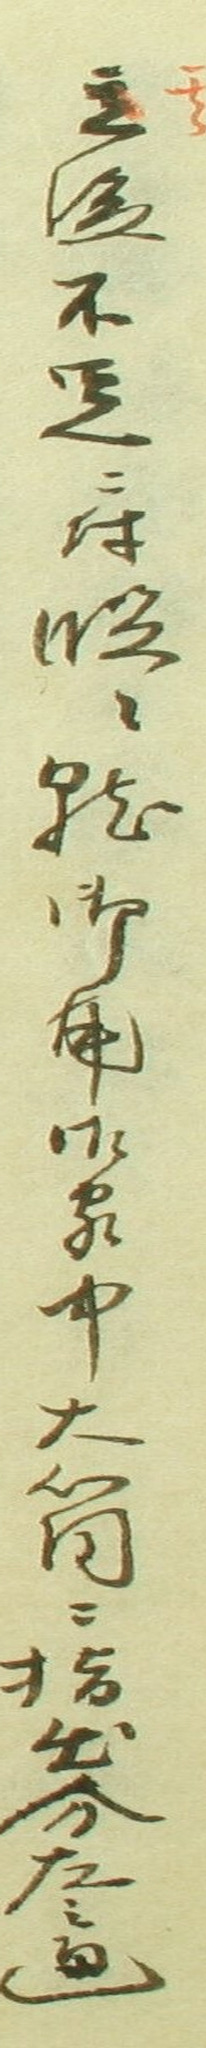其後不足ニ付段々就御用御家中大筒ニ指出分左之通
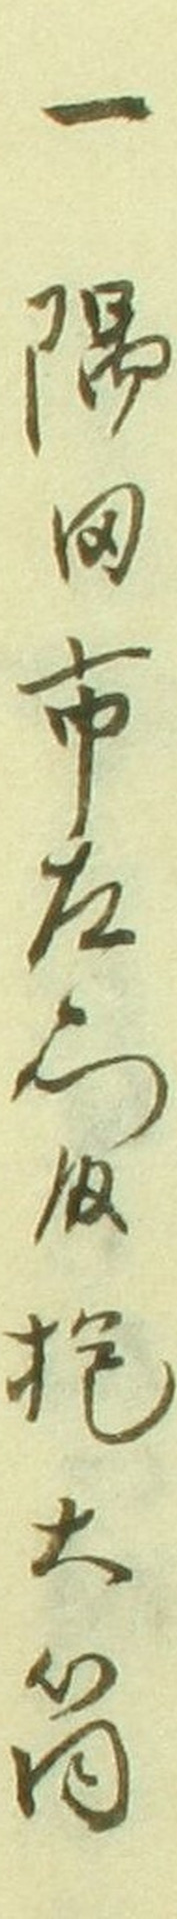一隅田市左衛門抱大筒
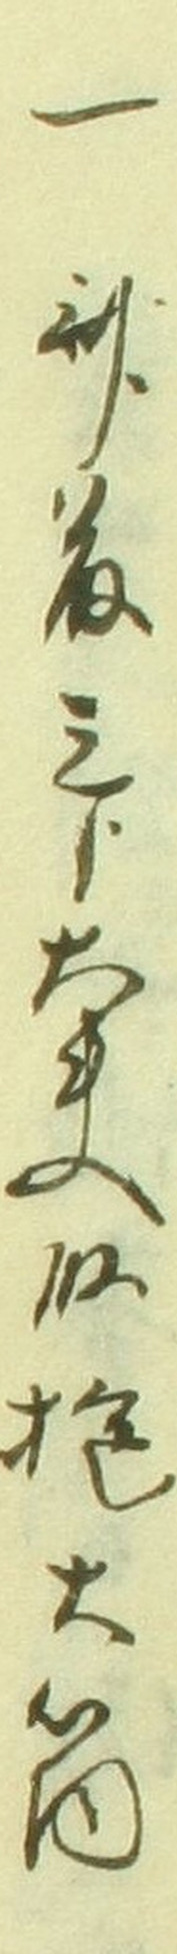一斉藤三郎太夫殿抱大筒
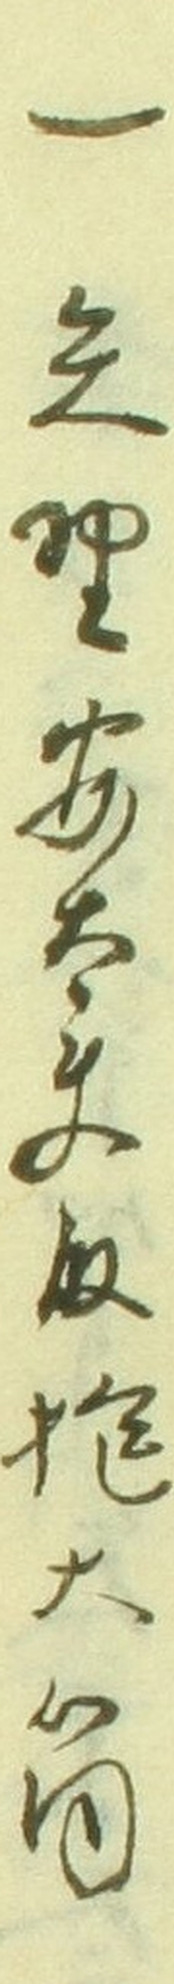一矢野安太夫殿抱大筒
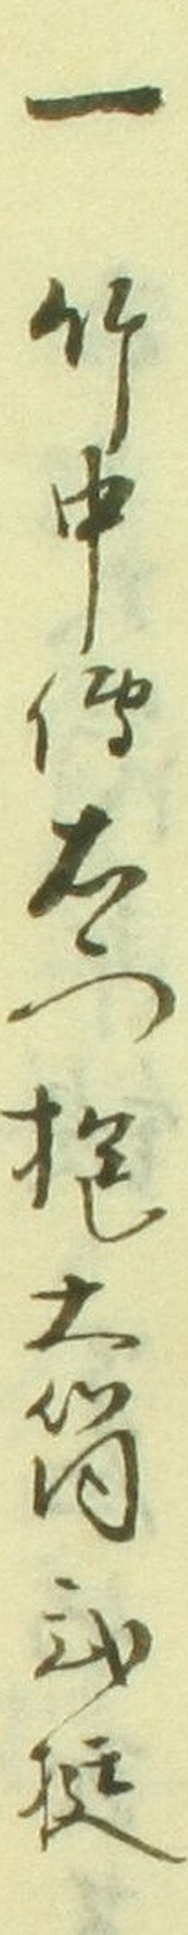一竹中伝右衛門抱大筒弐挺
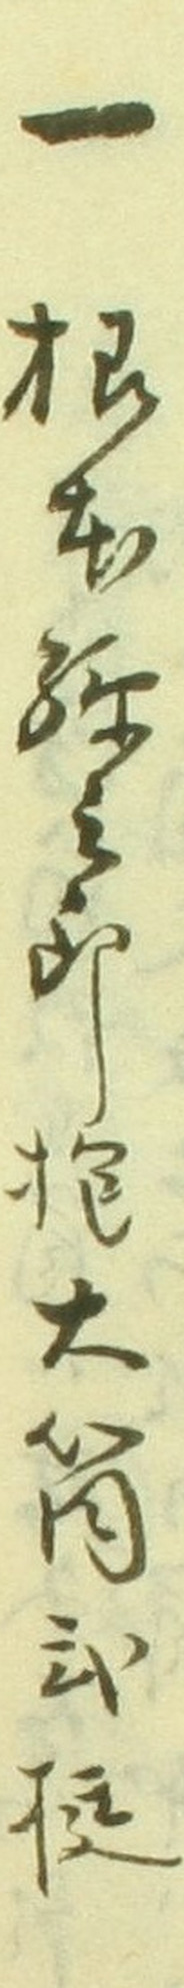一根本弥三郎抱大筒弐挺
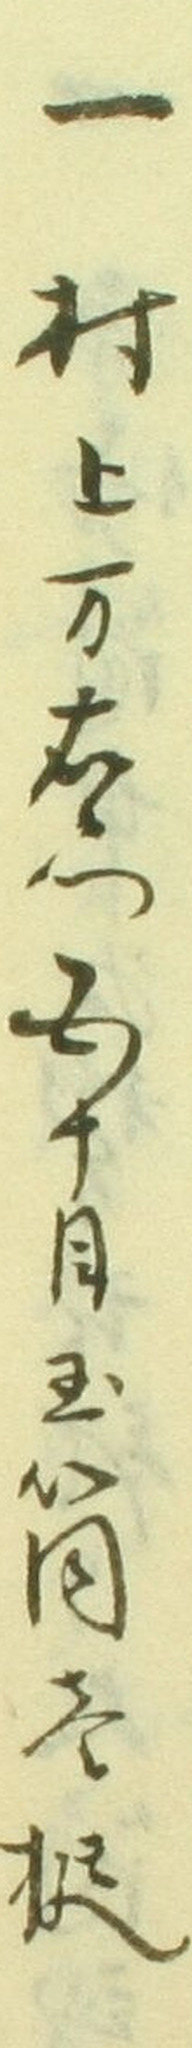一村上万右衛門五十目玉筒壱挺
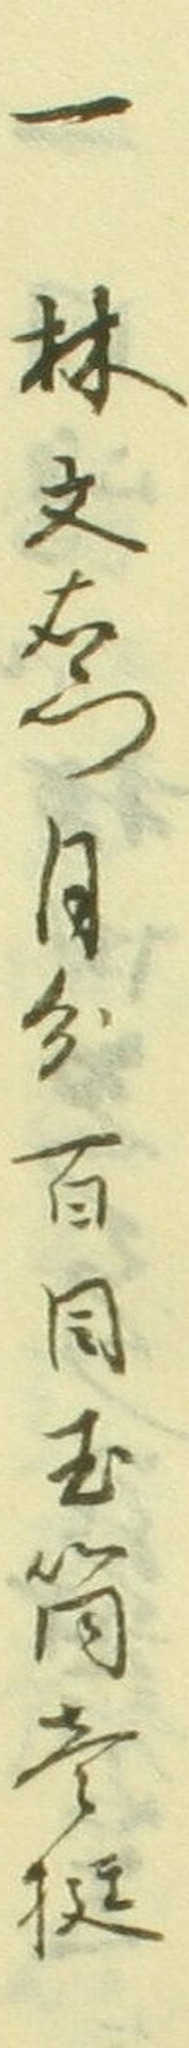一林文右衛門目分百目玉筒壱挺
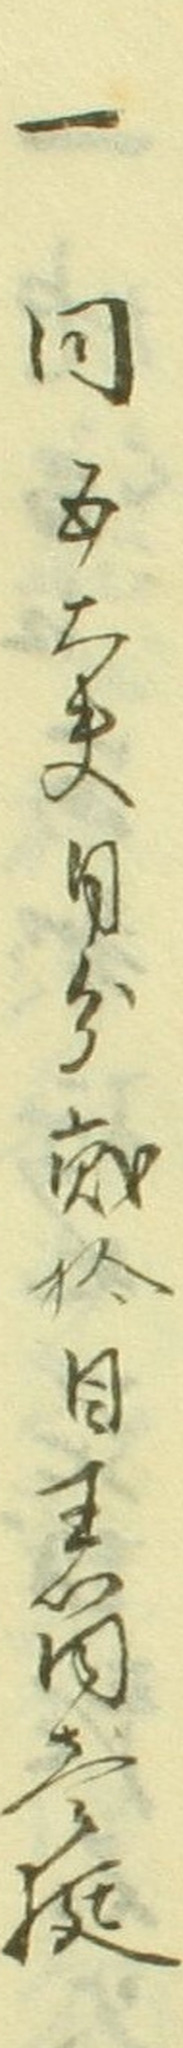一同五太夫目分弐拾目玉筒壱挺
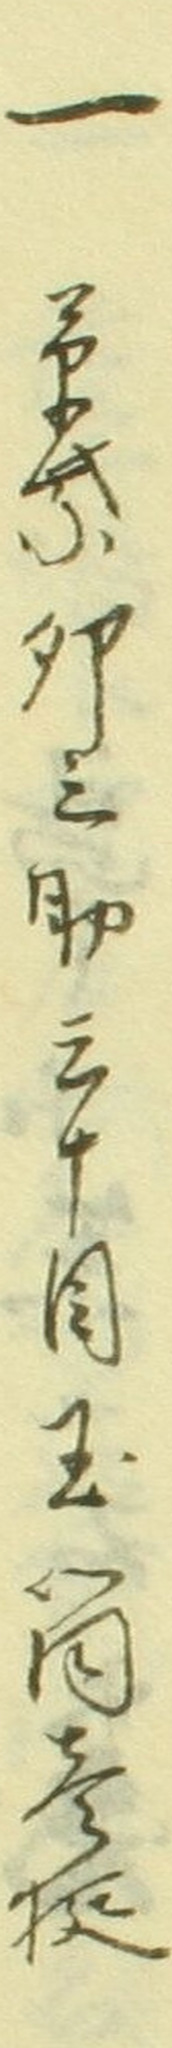一草葉卯之助三十目玉筒壱挺
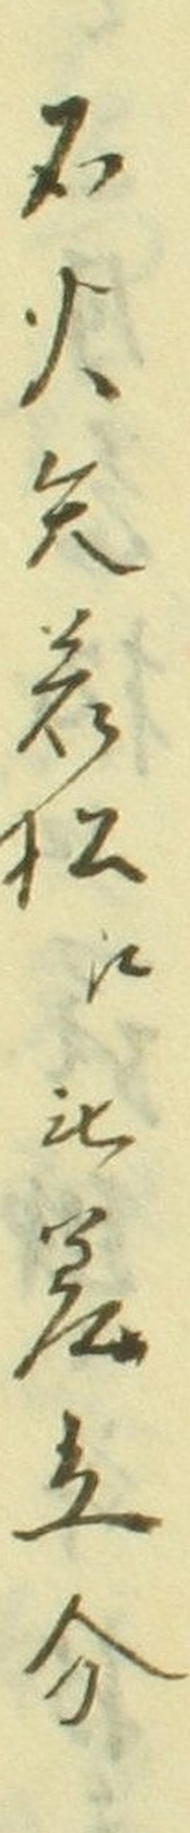石火矢若松江被差立分
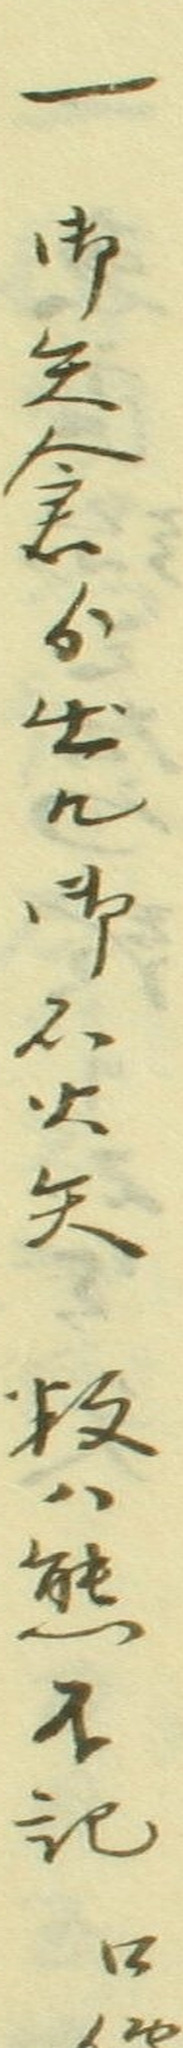一御矢倉ゟ出ル御石火矢数は態不記口傳
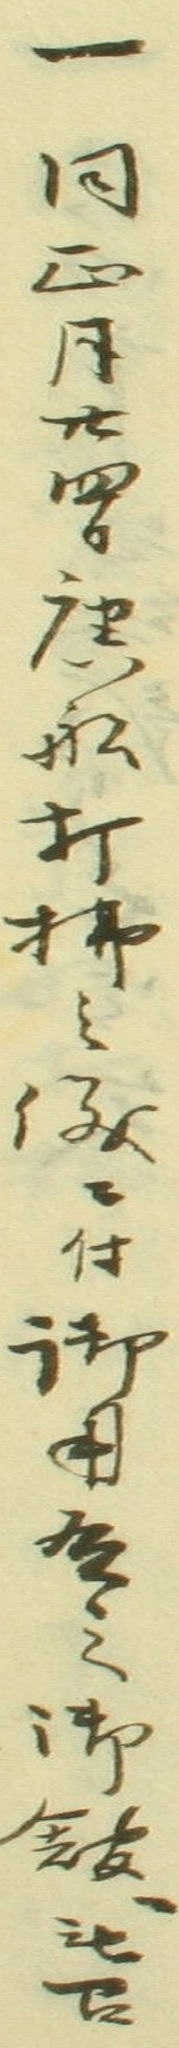一同正月廿四日唐船打払之儀ニ付御用有之御館へ被召
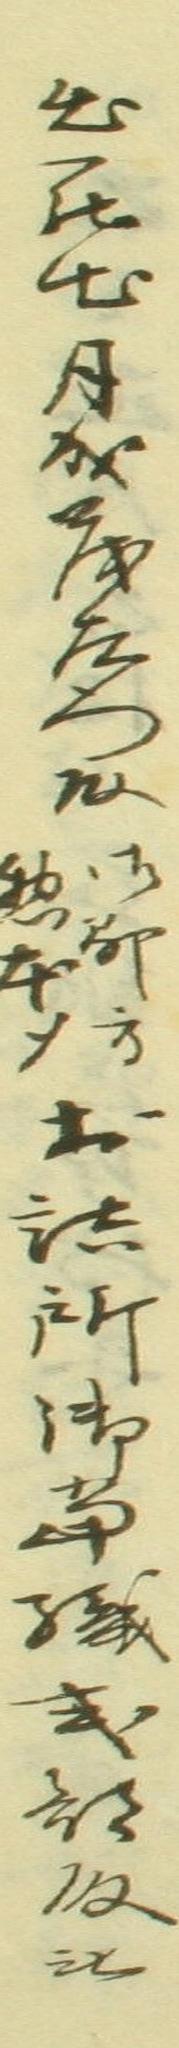出罷出月成茂左衛門殿御郡方惣本〆於詰所御当職式部殿被
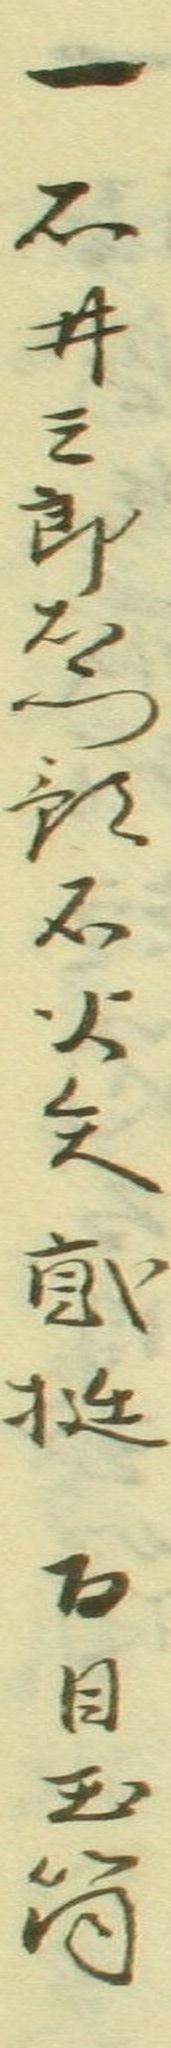一石井三郎右衛門預石火矢弐挺百目玉筒
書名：唐船漂流記 二
